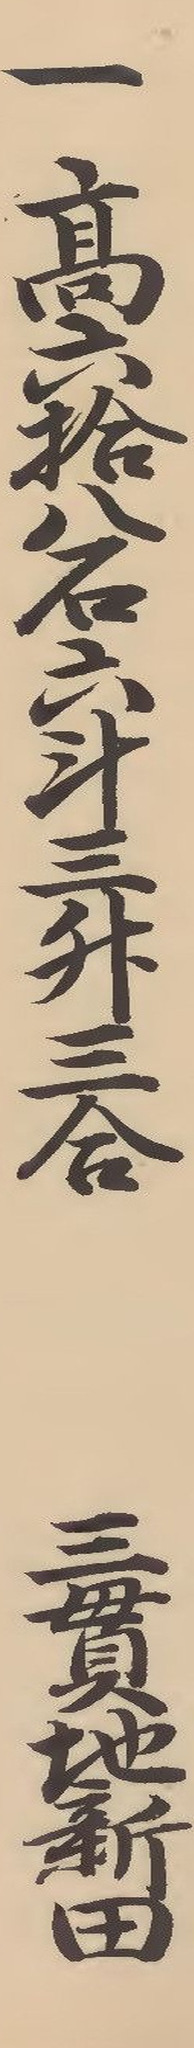一高六拾八石六斗三升三合三貫地新田
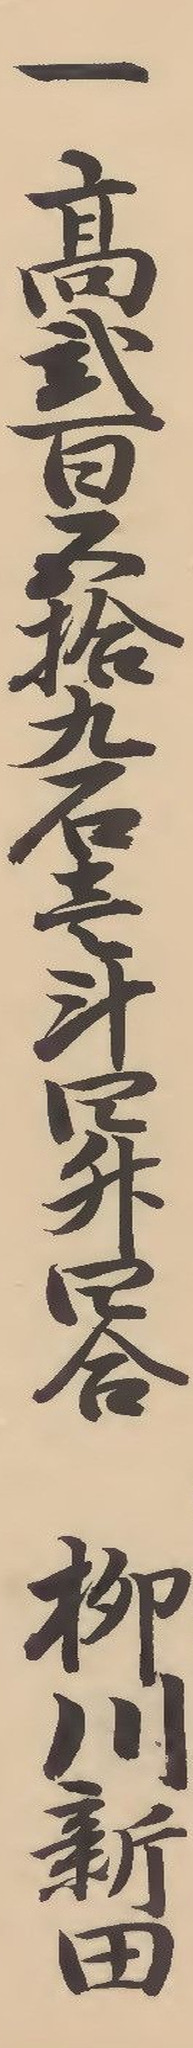一高弐百五拾九石壱斗四升四合柳川新田
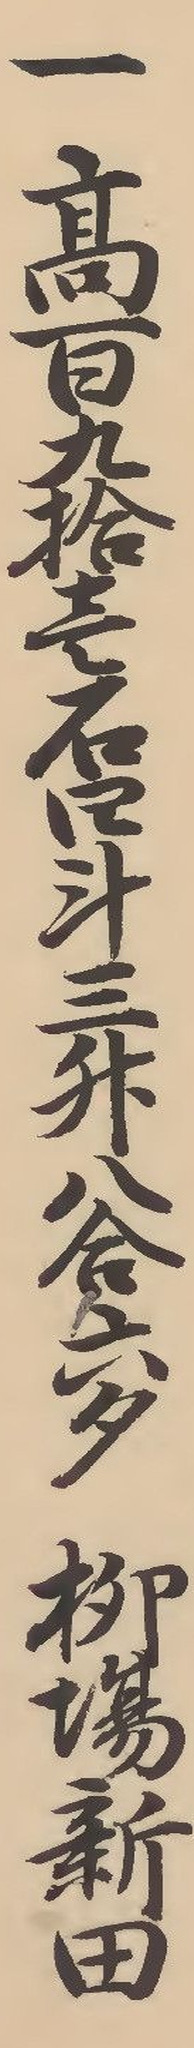一高百九拾壱石四斗三升八合六勺柳場新田

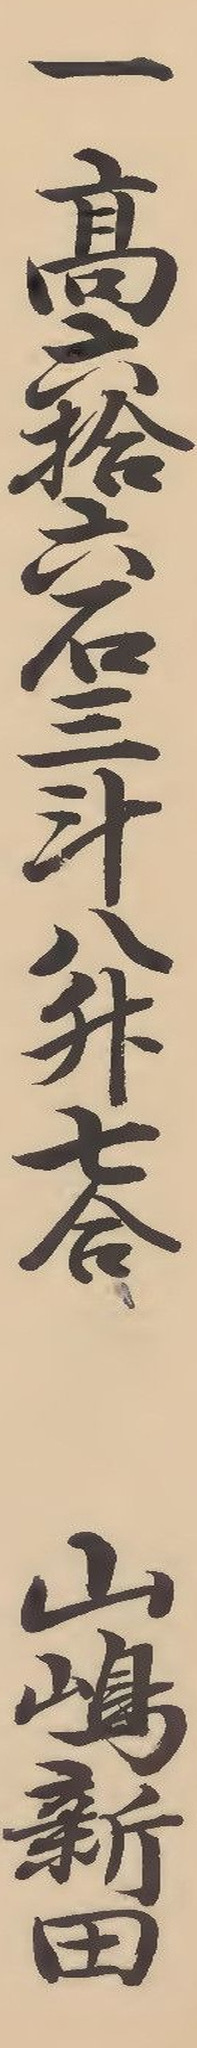一高六拾六石三斗八升七合山島新田
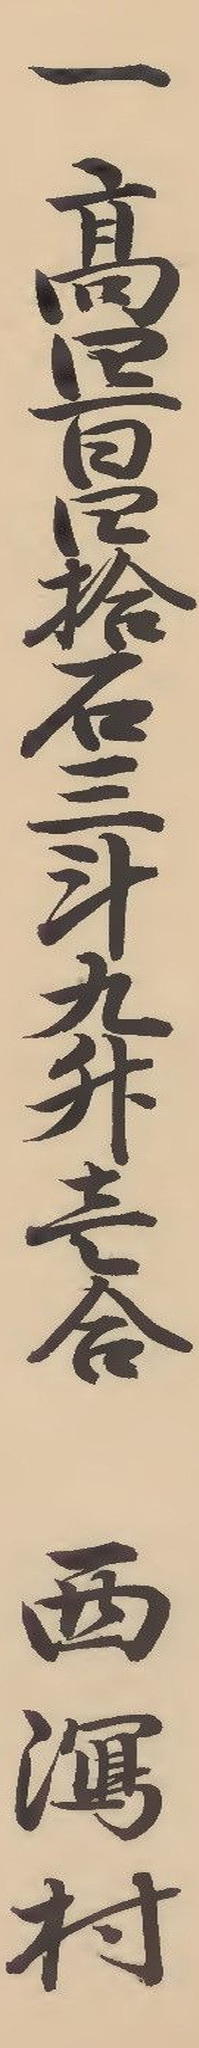一高四百四拾石三斗九升壱合西潟村
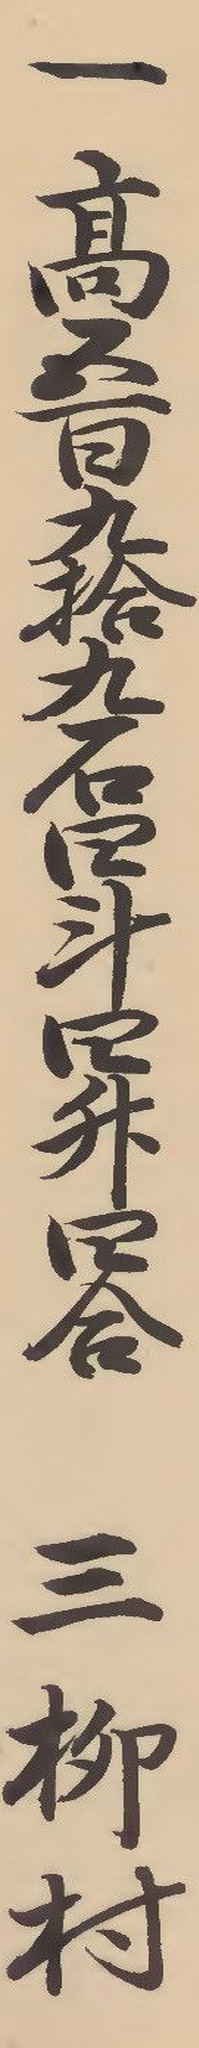一高五百九拾九石四斗四升四合三柳村
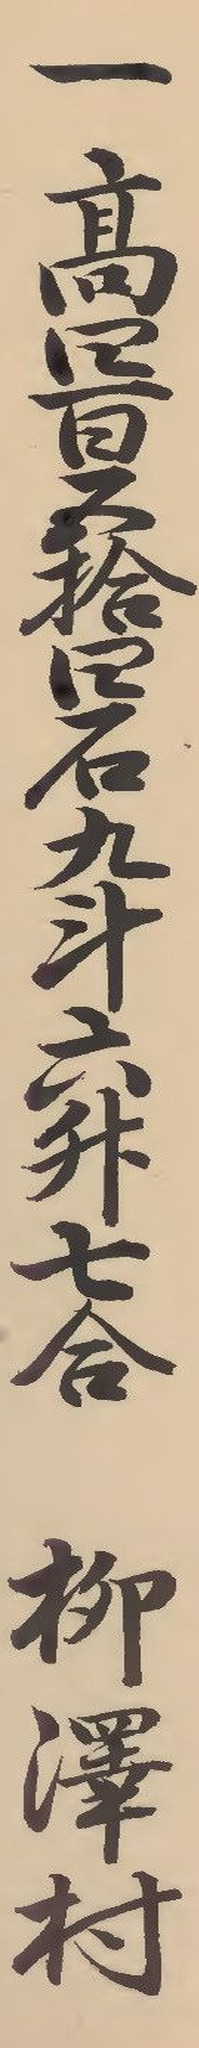一高四百五拾四石九斗六升七合柳沢村
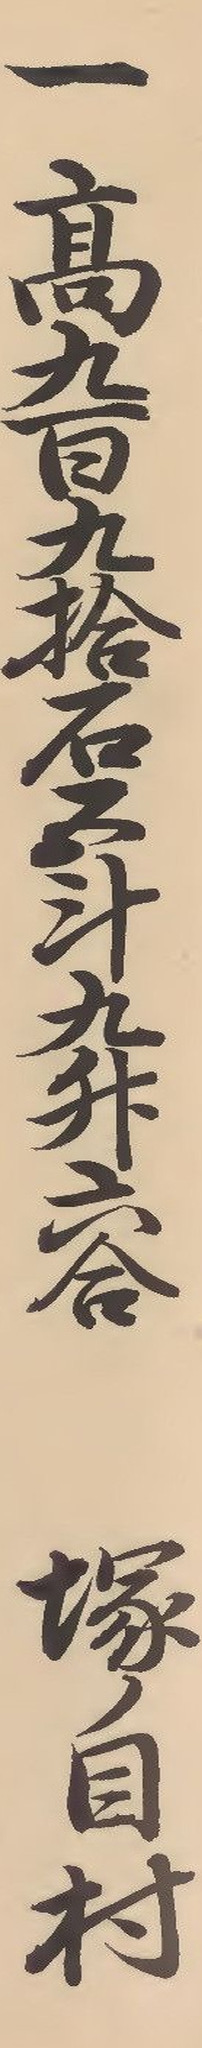一高九百九拾石五斗九升六合塚ノ目村
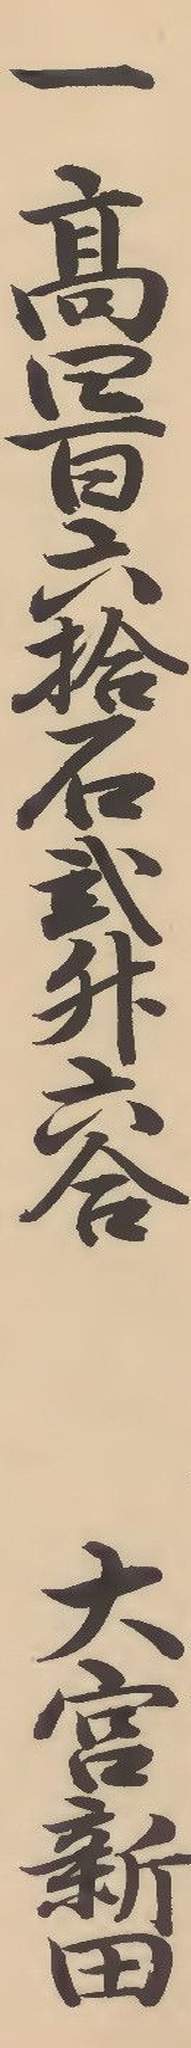一高四百六拾石弐升六合大宮新田
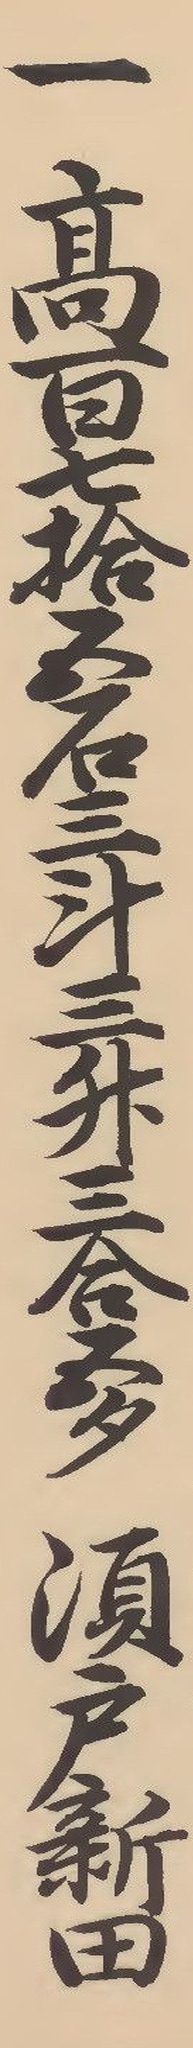一高百七拾五石三斗三升三合五勺須戸新田
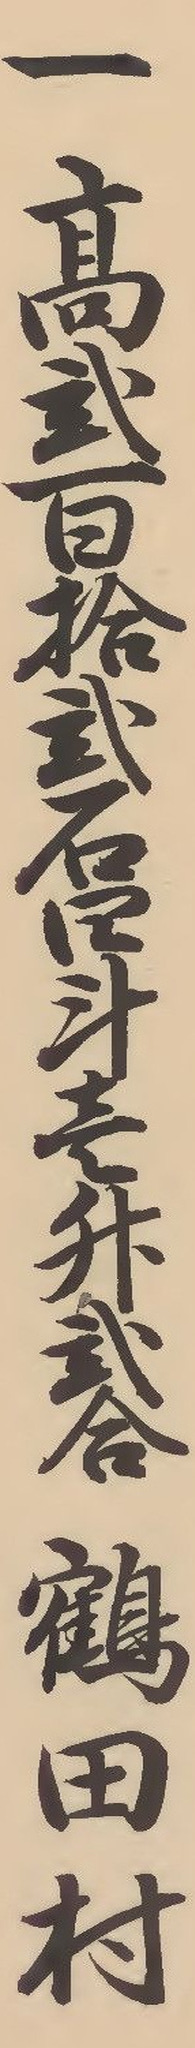一高弐百拾弐石四斗壱升弐合鶴田村

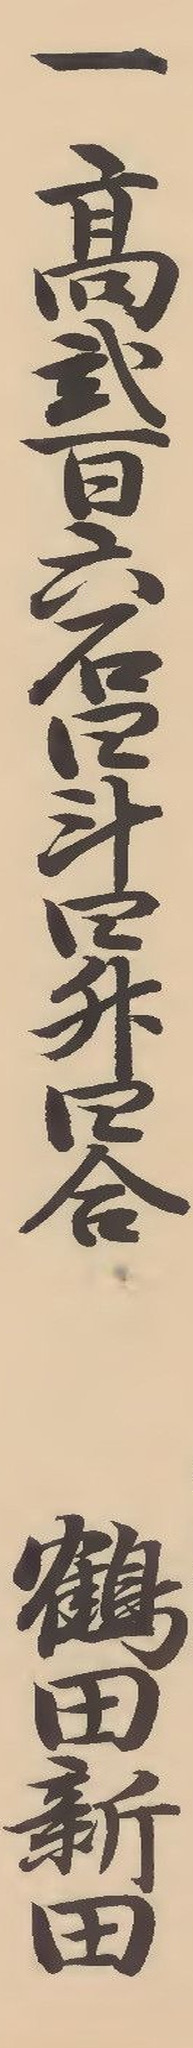一高弐百六石四斗四升四合鶴田新田
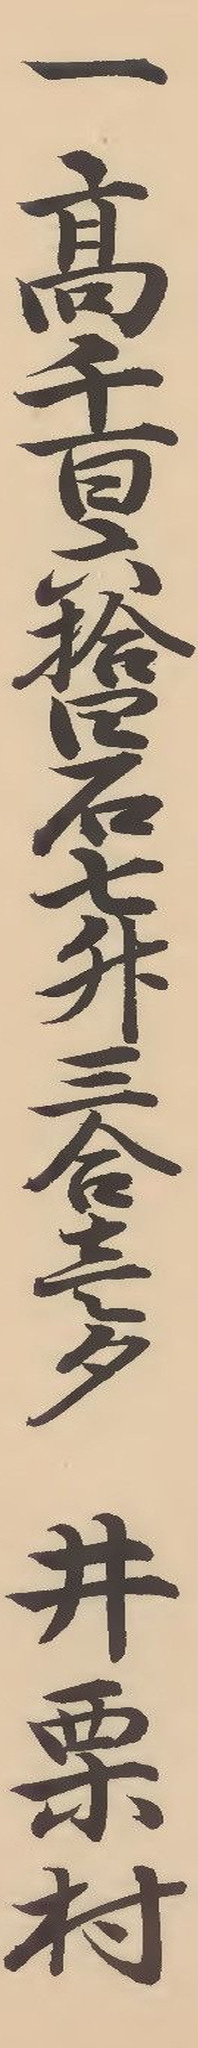一高千百六拾四石七升三合壱勺井栗村
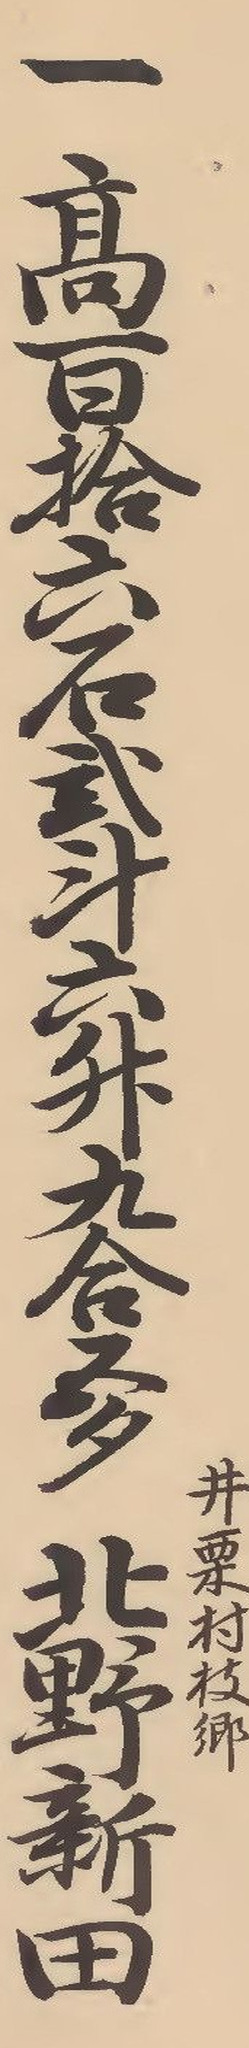一高百拾六石弐斗六升九合五勺北野新田
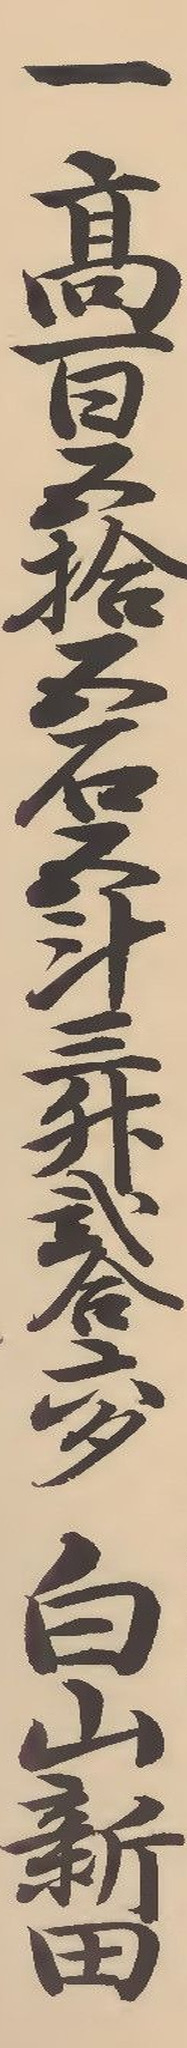一高百五拾五石五斗三升弐合六勺白山新田
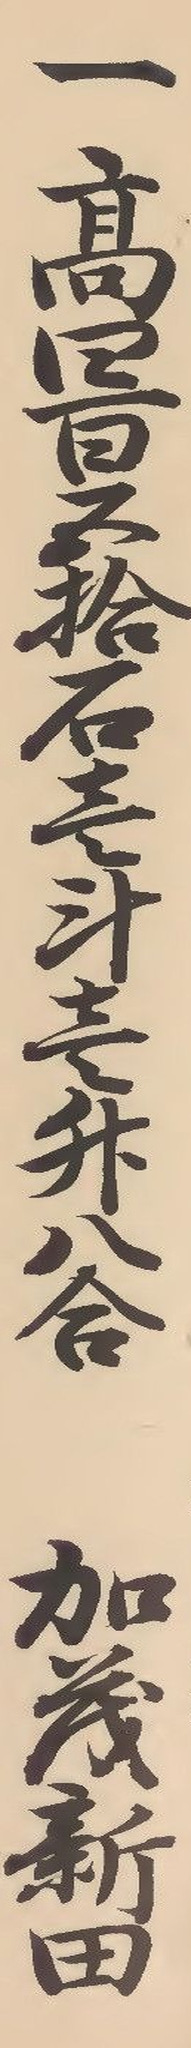一高四百五拾石壱斗壱升八合加茂新田
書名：越後国郷帳　下
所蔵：国立公文書館 National Archives of Japan
